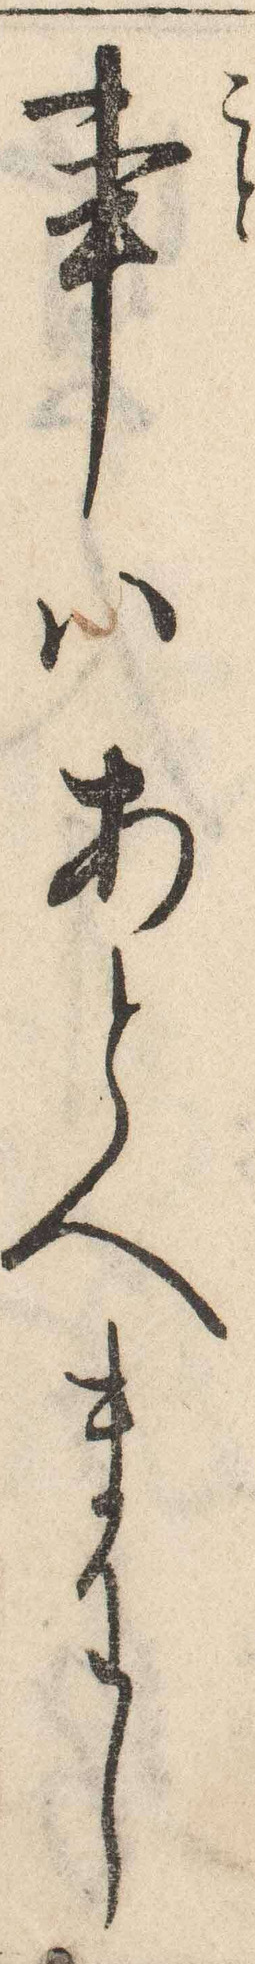事はあとへまわし
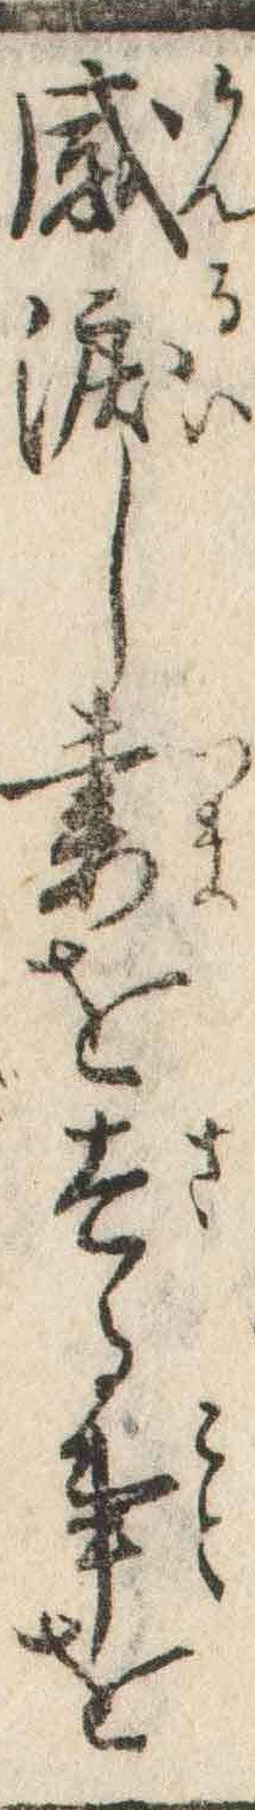感涙し妻を去る事を
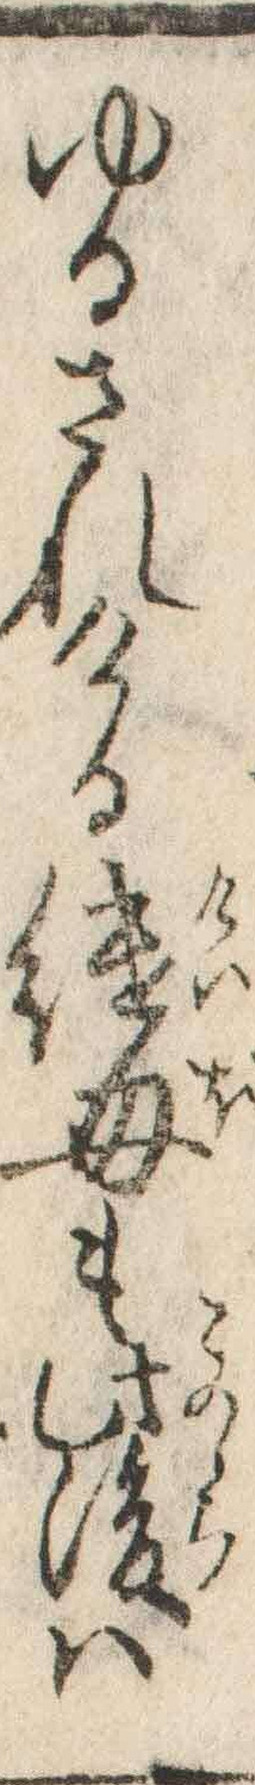ゆるされける継母も此後は
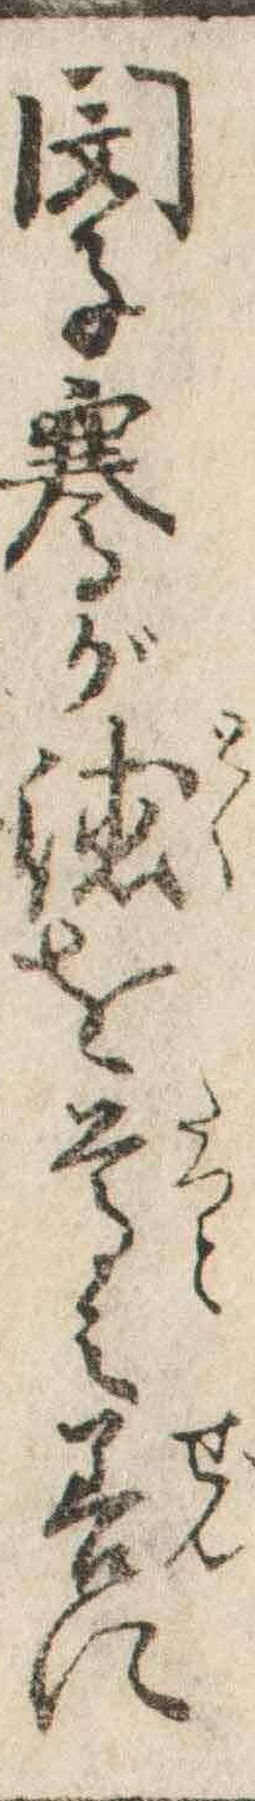閔子騫が徳を尊み善に
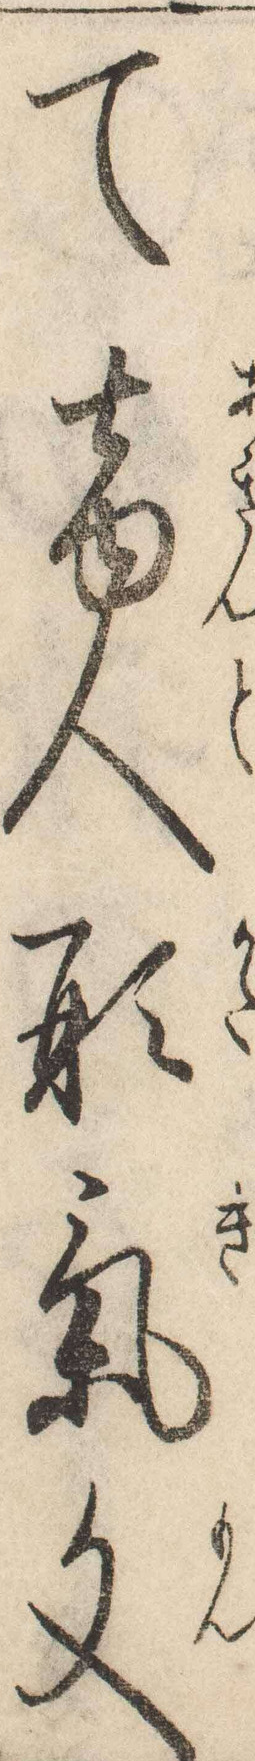て商人形気文
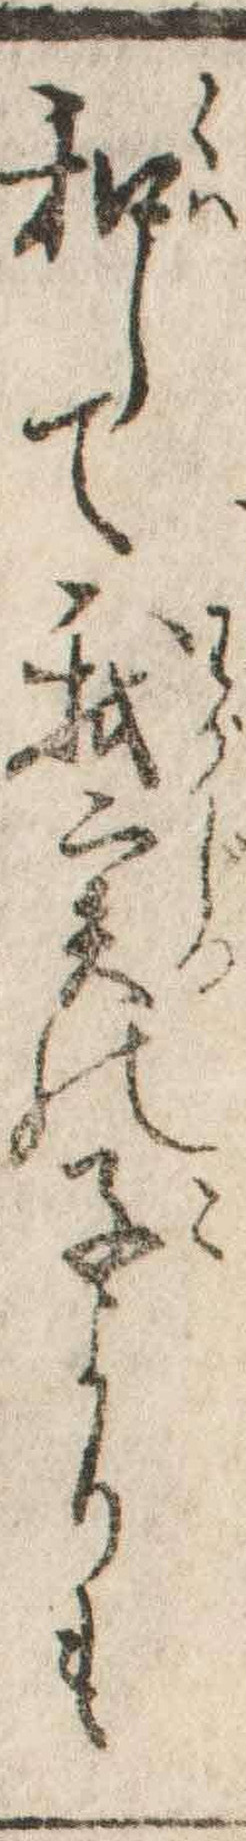和して我実の子よりも
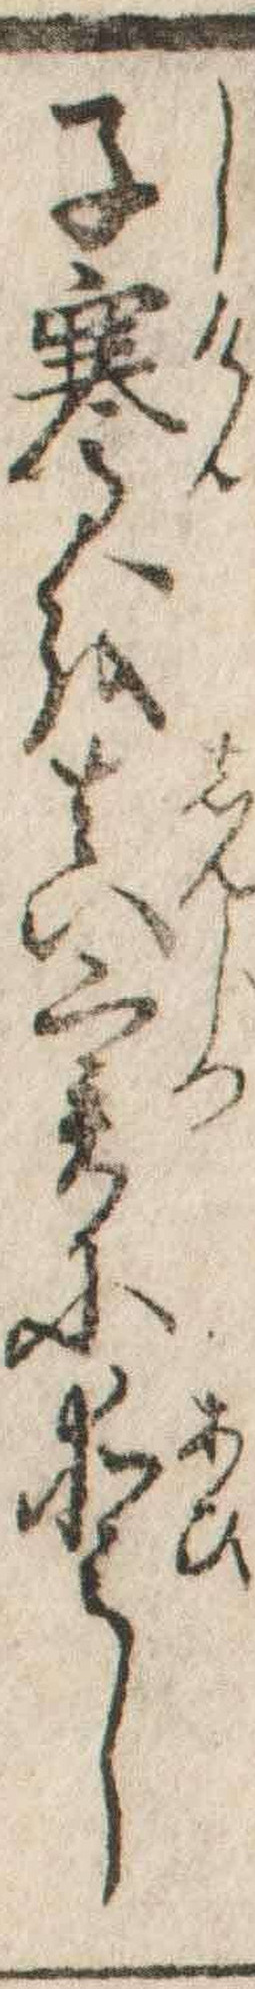子騫を真実に愛し
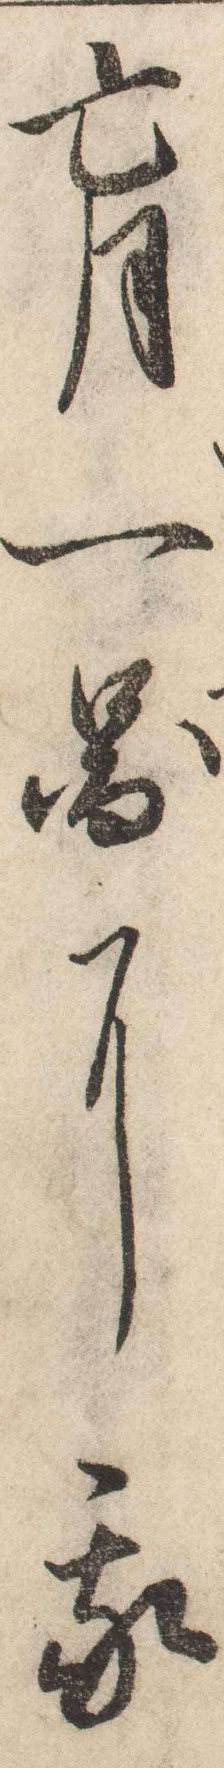盲一図に我
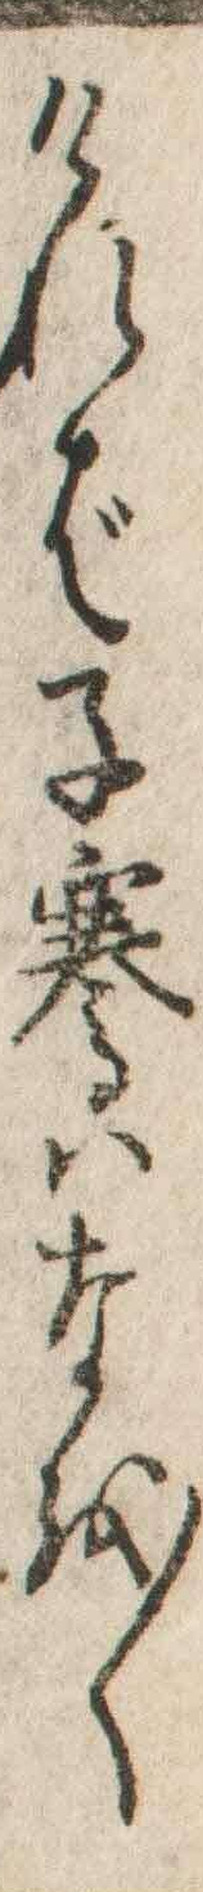ければ子騫はなを〳〵
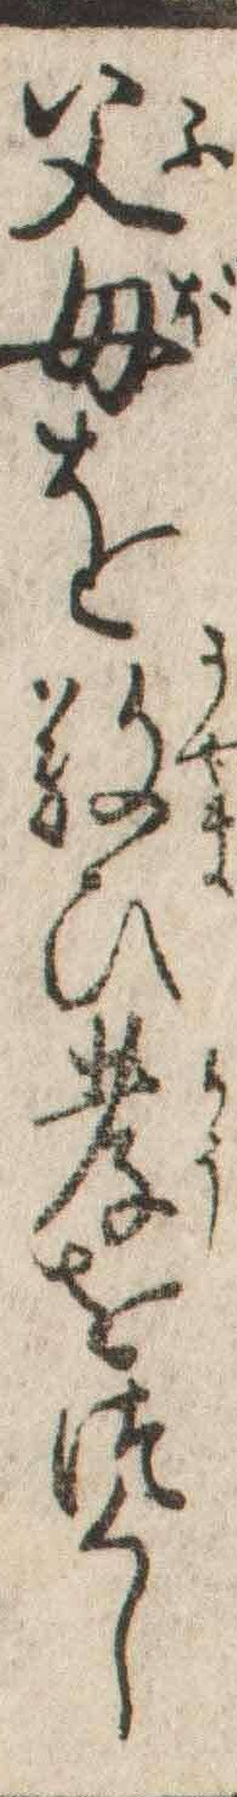父母を敬ひ孝をつくし
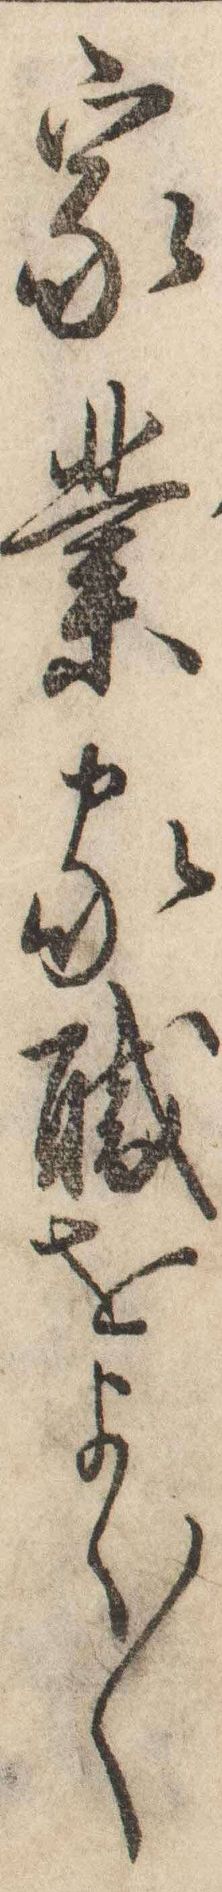家業家職をよく〳〵
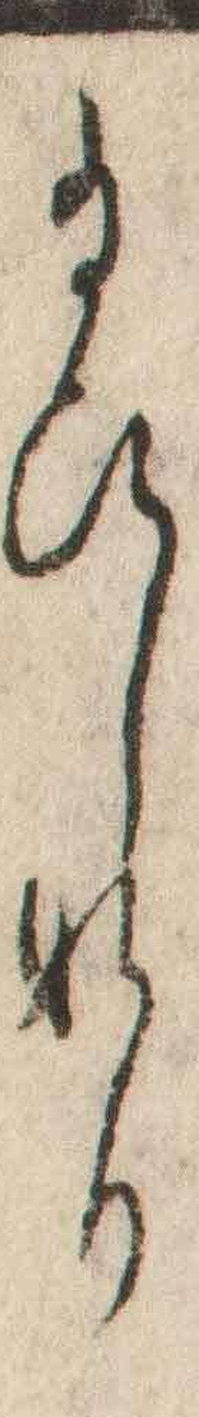給ひしなり

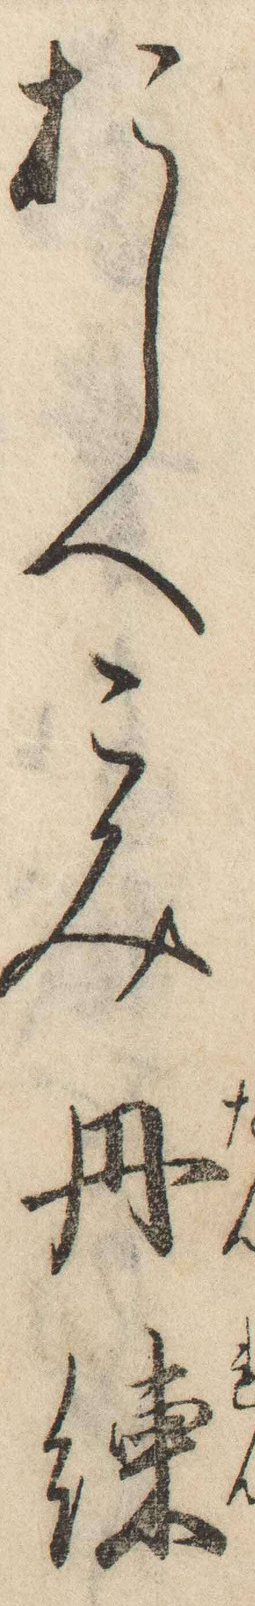おしへこみ丹練
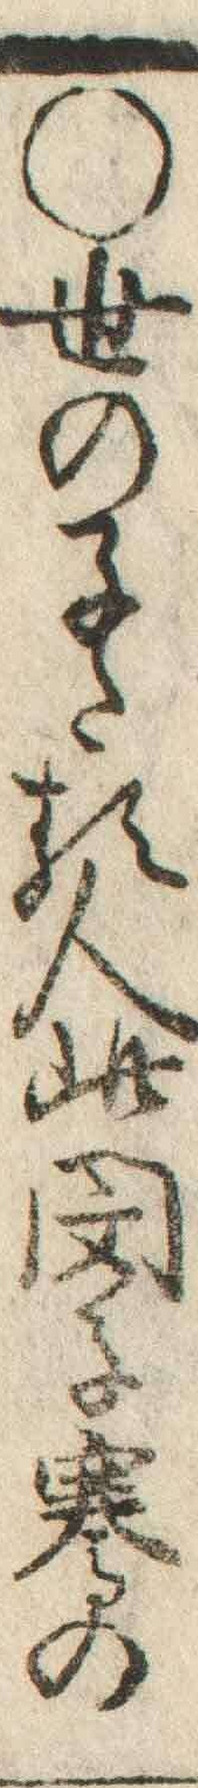〇世の子たる人此閔子騫の
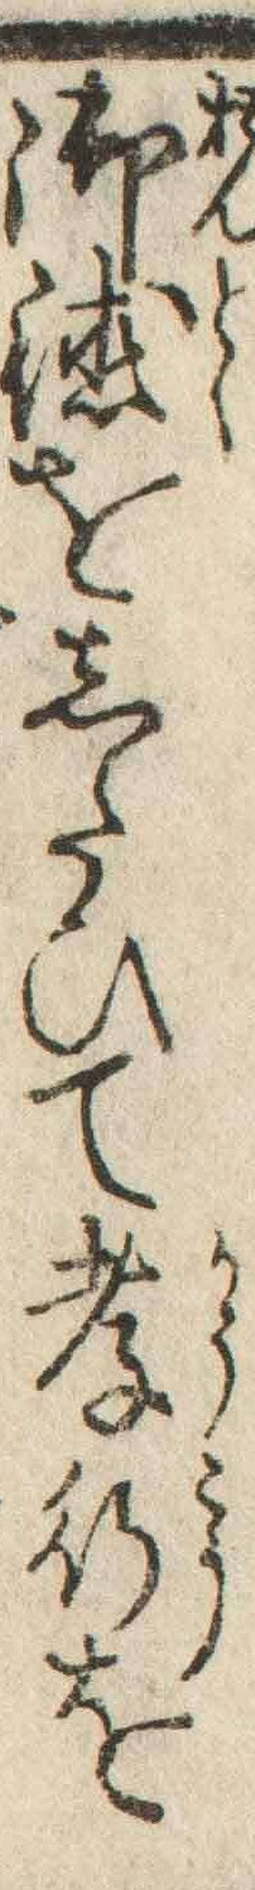御徳をしたひて孝行を
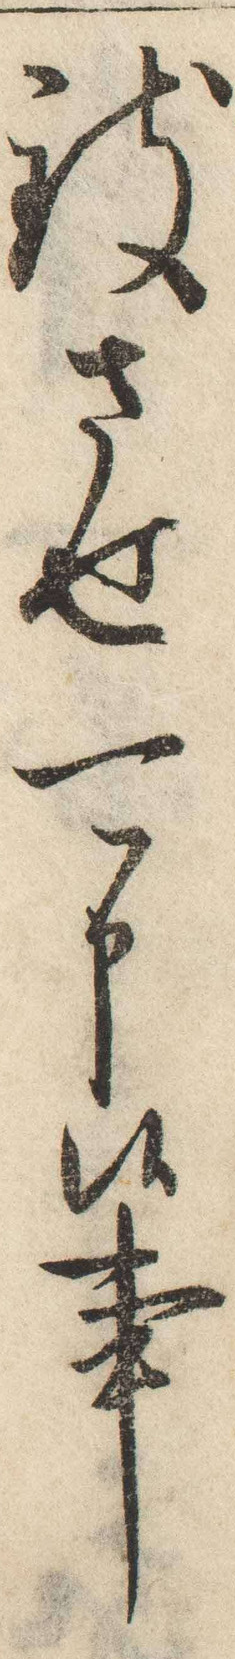致させ可申候事
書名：撫育草
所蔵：東京学芸大学附属図書館 国文学研究資料館
